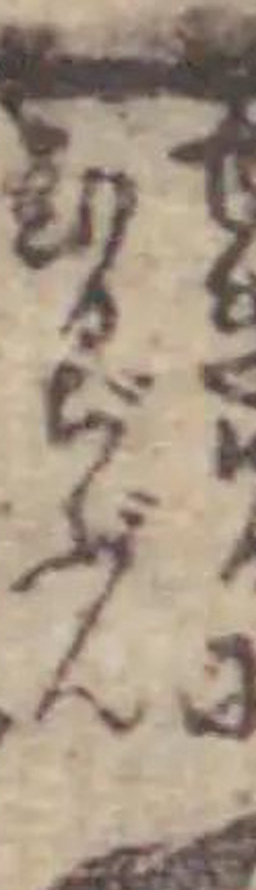ひるぢぶん
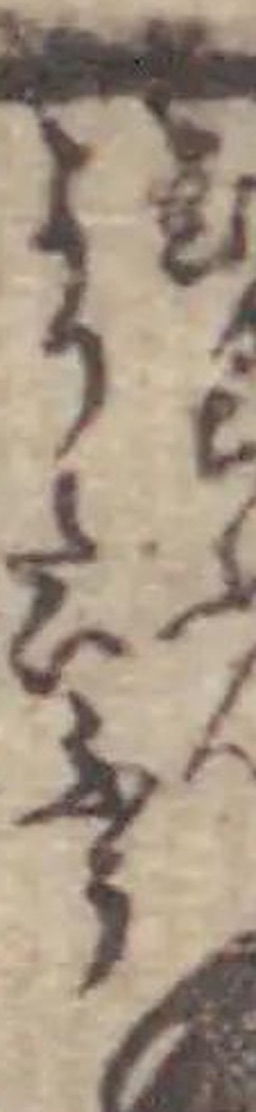よりたいふう
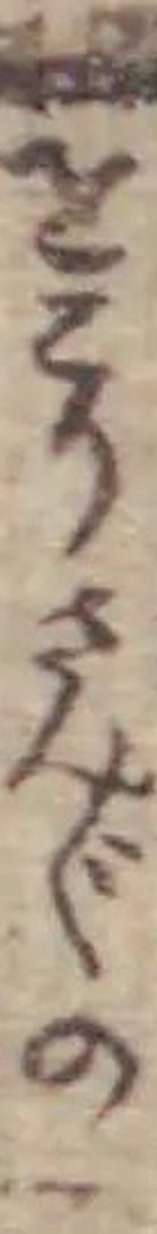をこりさん〴〵の
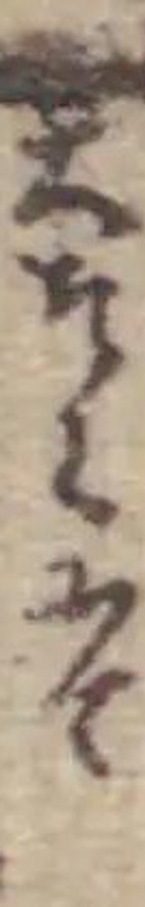大なみにて
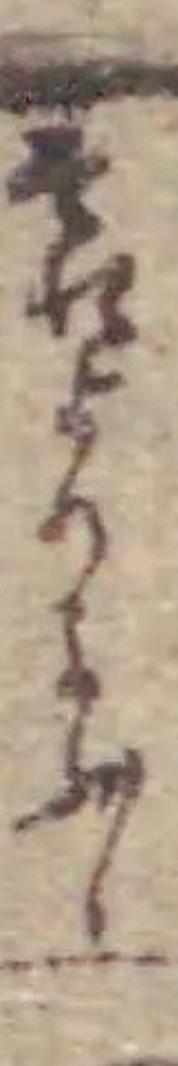それよりよふ〳〵
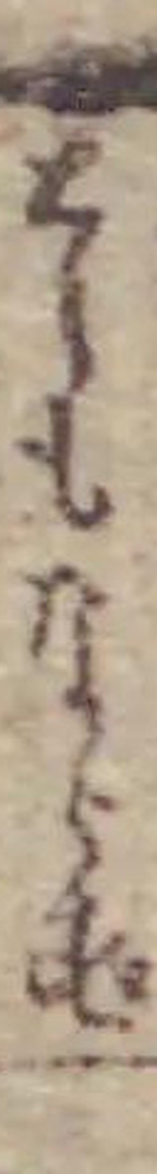とうもならず
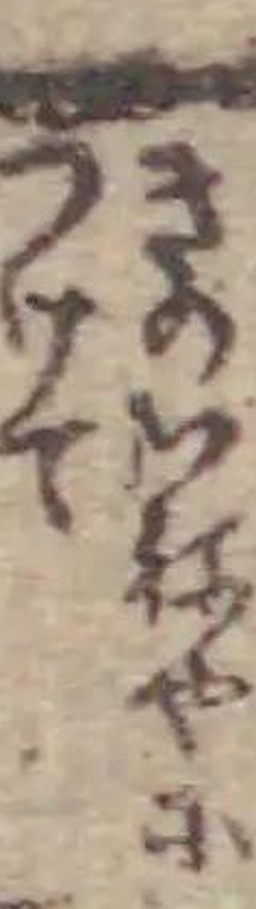つけて
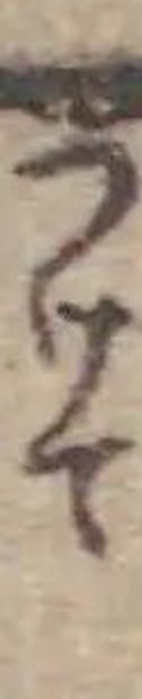つけて
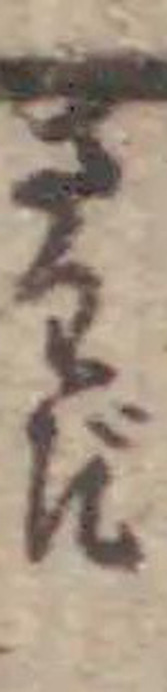さわぎ

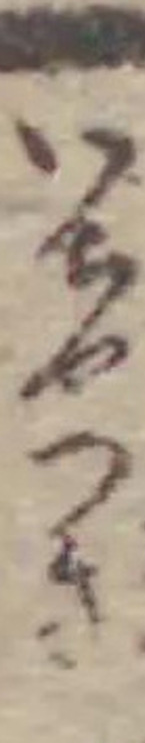いちやつき
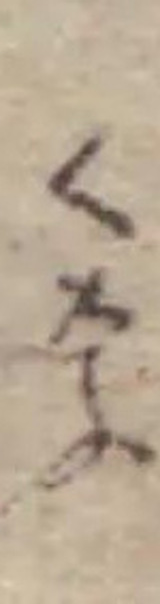くろふ
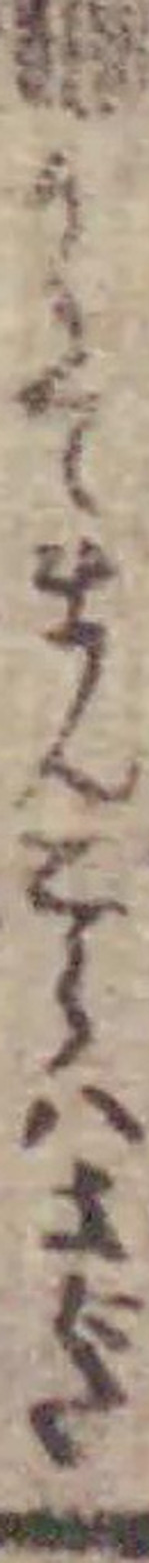かくてまんこうはさだ
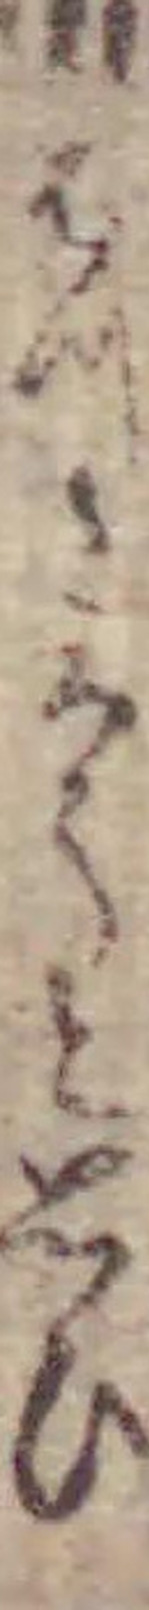ばつたろうと思ひ
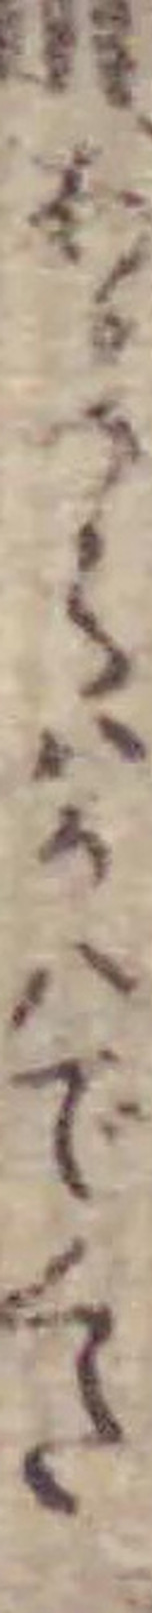あヱつらはかはでくた
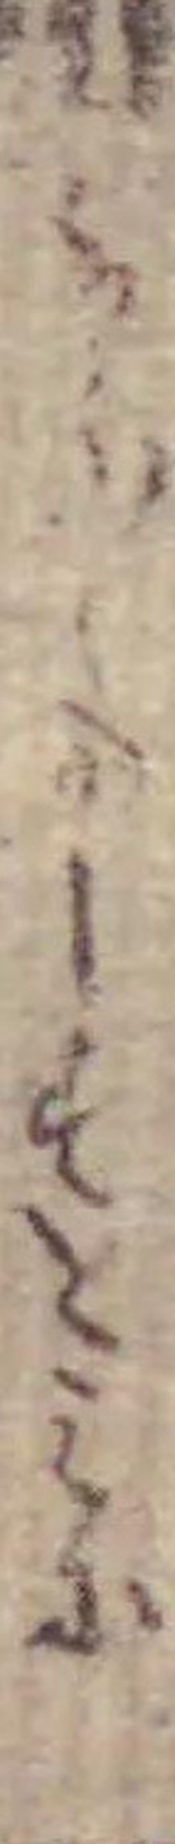ぶら〳〵やうすをみに
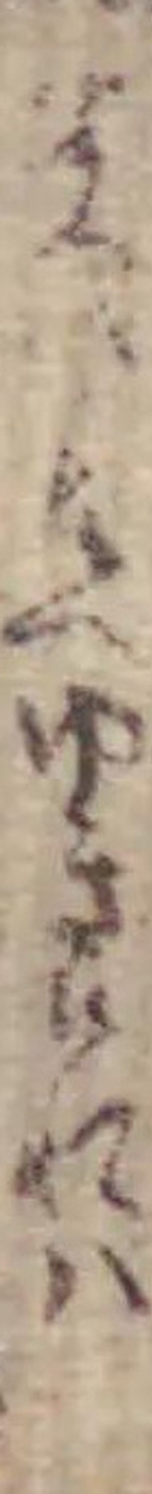まつさきへゆきけれは
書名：通人為真似 2巻
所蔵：国立国会図書館 National Diet Library, JAPAN
